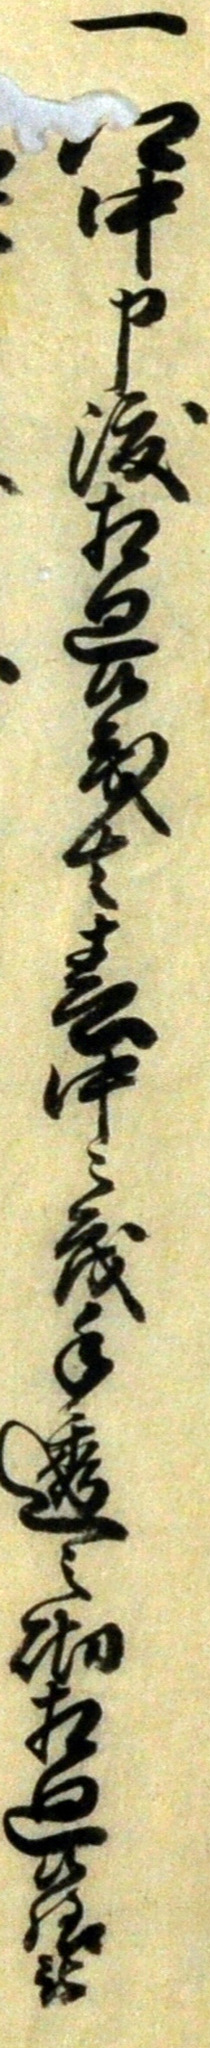一郷中申渡相廻候義者春中ニ茂手透之砌相廻候様被
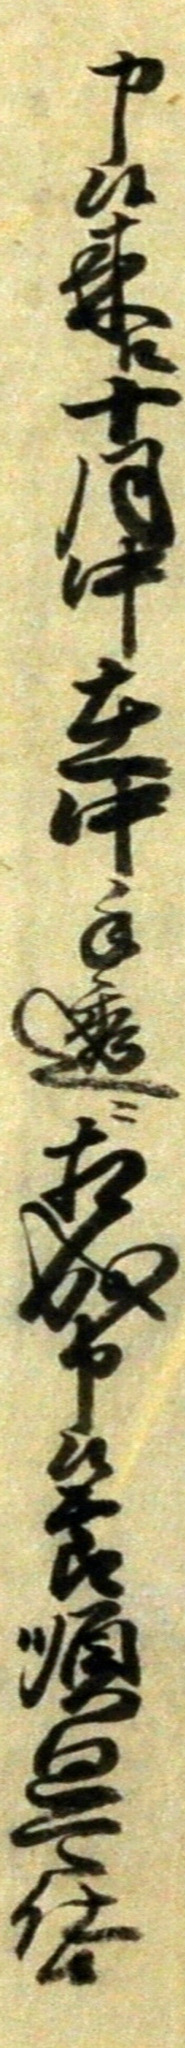申候来ル十月中在中手透ニ相成申候節順廻可仕候
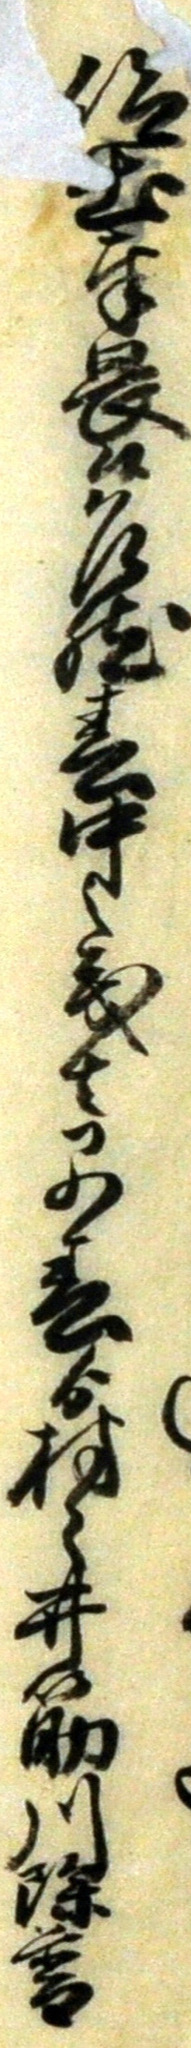仰出奉畏候乍然春中之義者早春ゟ村々井筋川除普
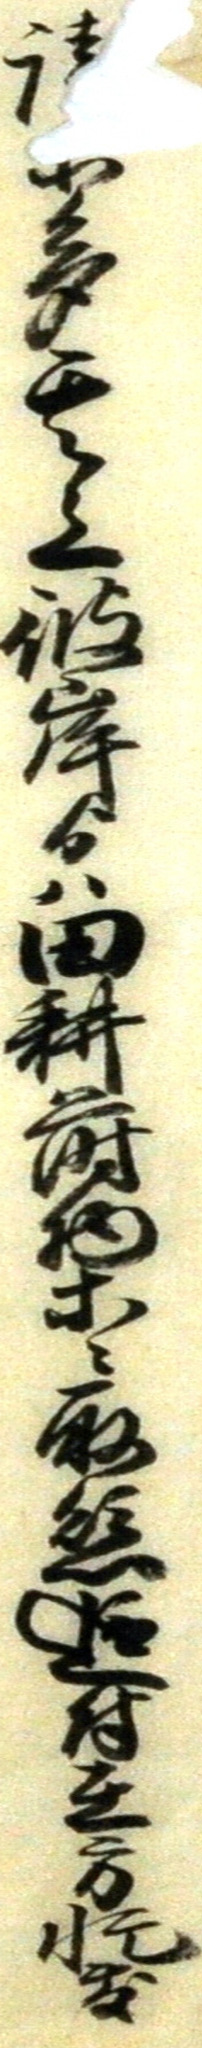請多其上彼岸ゟハ田耕蒔物等ニ取懸追付在方忙敷
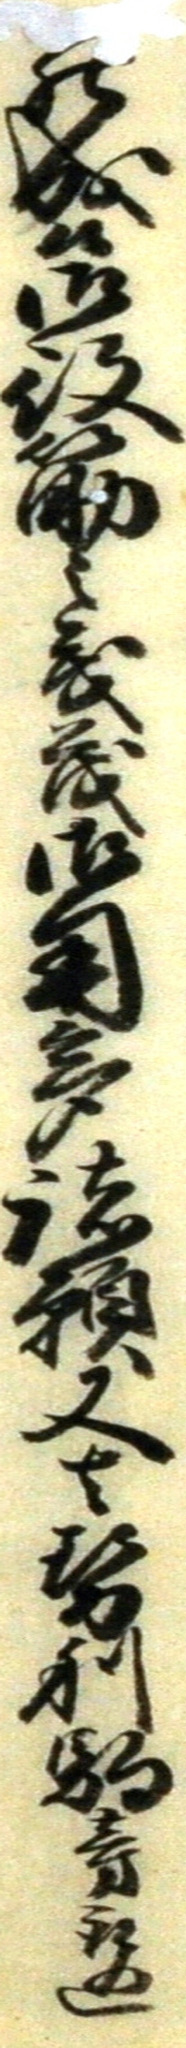罷成候御役筋之義茂御用多諸願又者せり駒旁取込
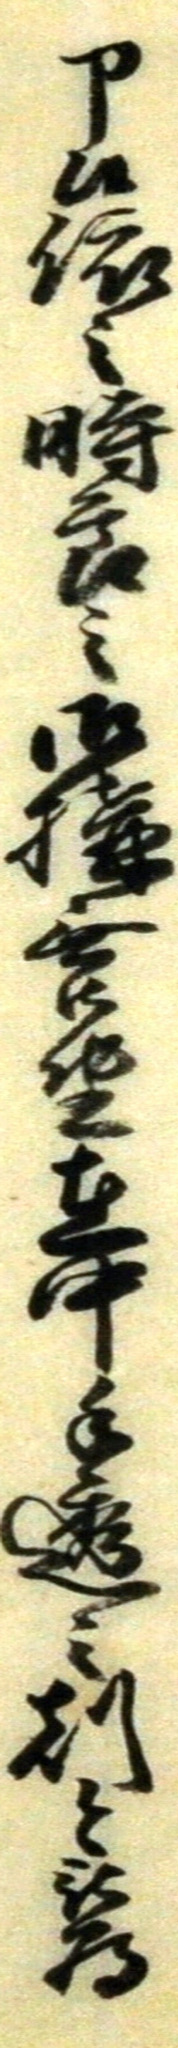申候依之時節之御構無御座在中手透之刻と被為
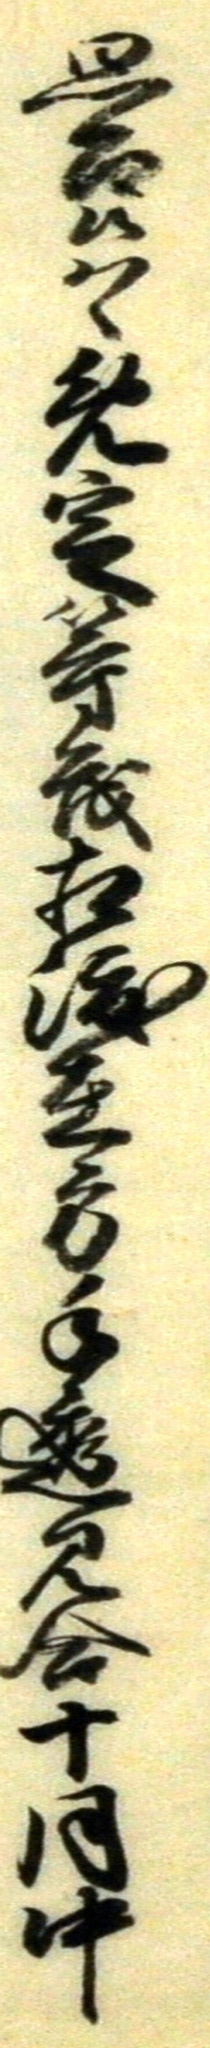思召候ハヽ免定等茂相渡在方手透見合十月中
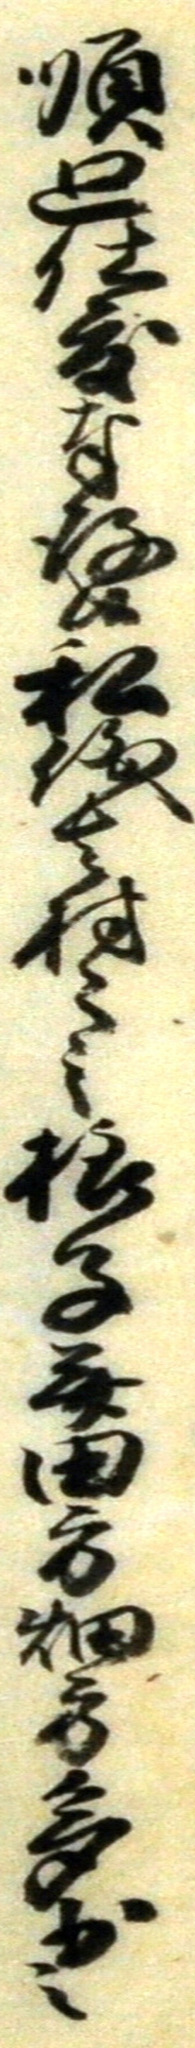順廻仕度奉存候私儀者村々之様子幷田方畑方多少之
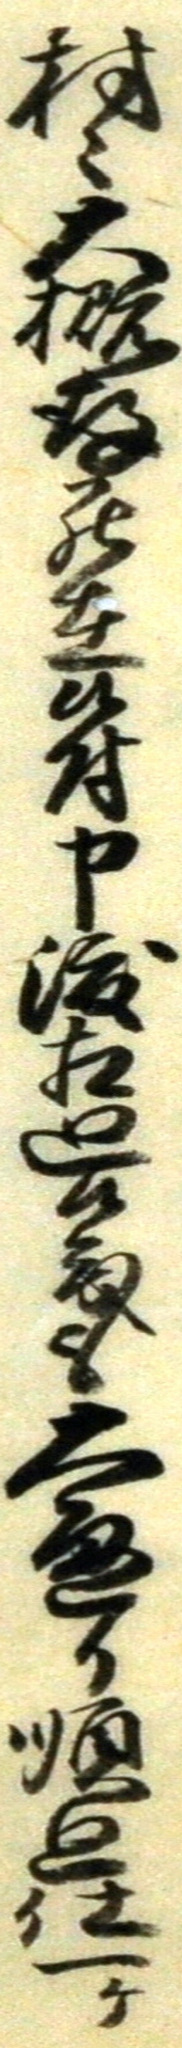村々大概存罷在候付申渡相廻候義茂大通り順廻仕一ヶ
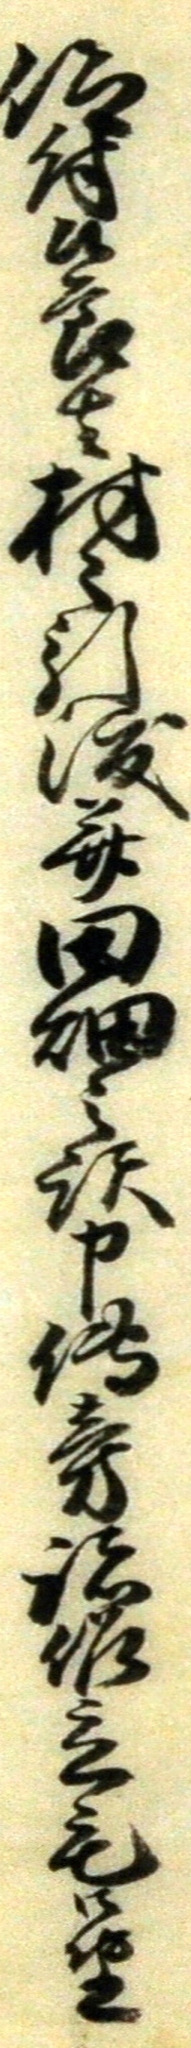仰付候節者村々引渡幷田畑之訳申伝旁諸作立毛御座
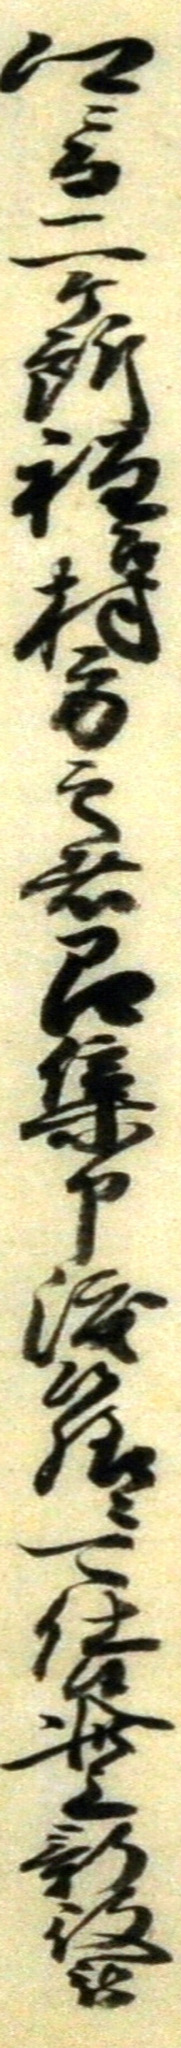郷ニ而二ヶ所程江村方之者召集申渡候様ニ可仕候此上新役被
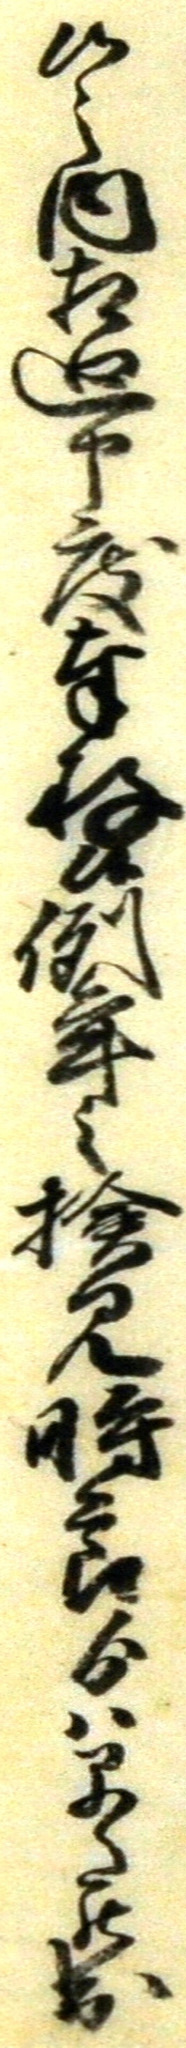候之内相廻申度奉存候例年之検見時節ゟハ早く罷出

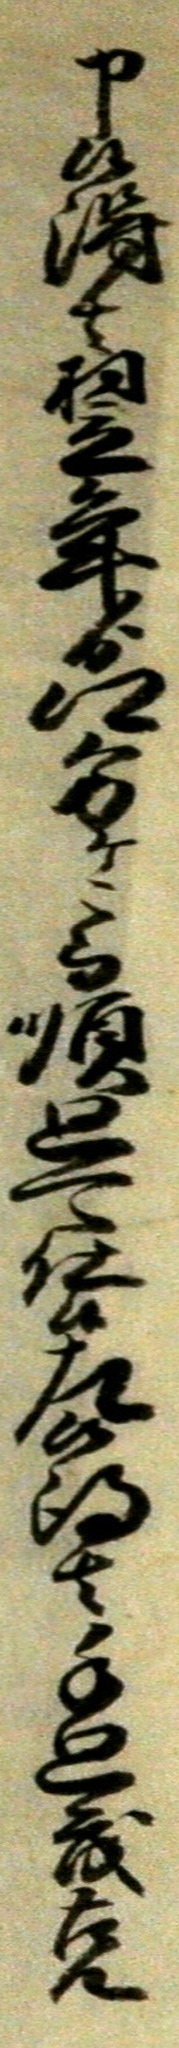申候得者翌年ゟ郷分ケニ而順廻可仕候左候得者手廻茂克
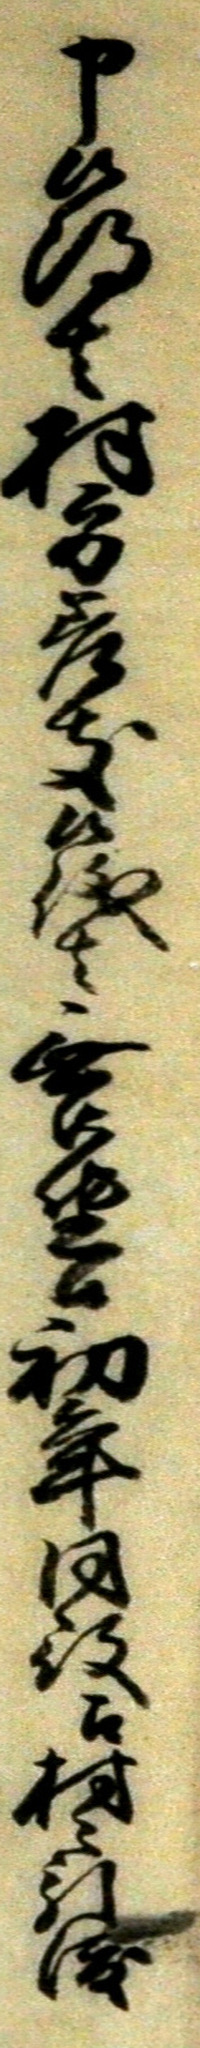申候得者村方差支候義者無御座候初年同役江村々引渡
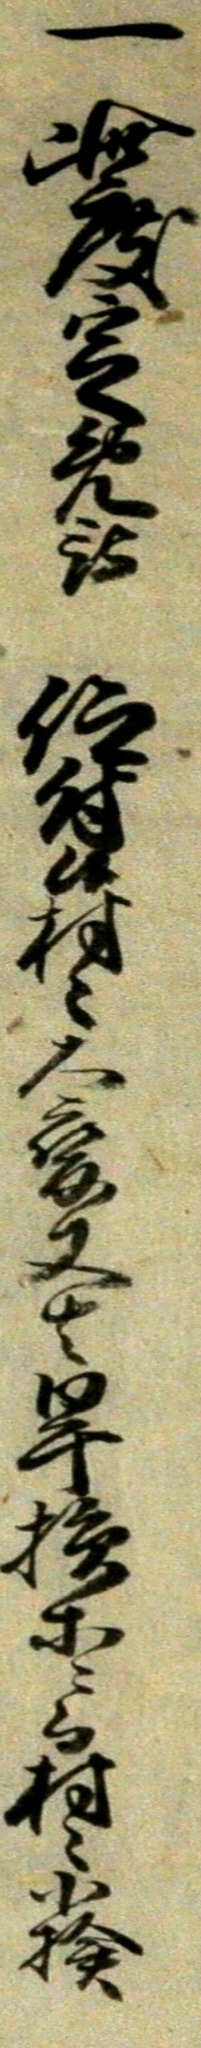一此度定免被仰付候村々大変又者旱損等ニ而村々小検
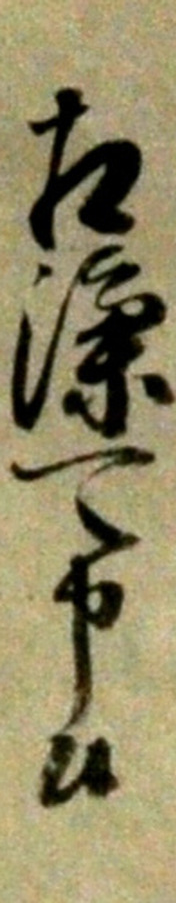相済可申候
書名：留書
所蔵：伊那市立高遠町図書館・合同会社AMANE
